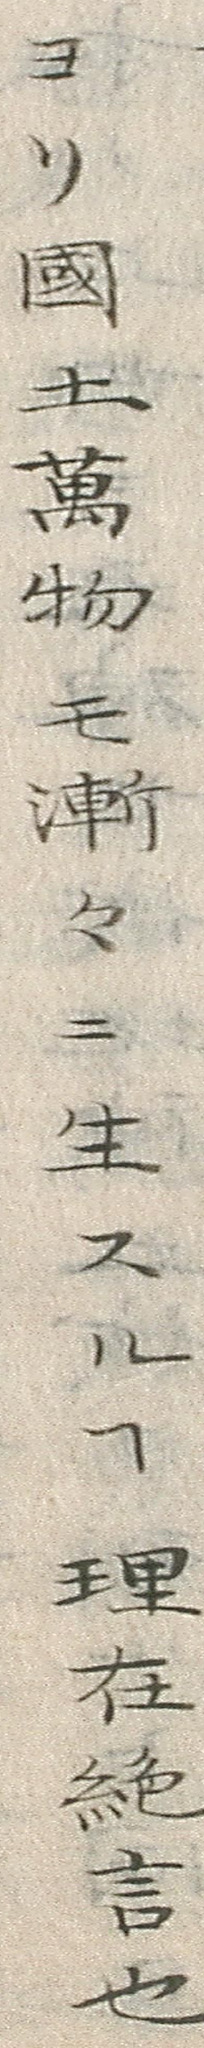ヨリ国土万物モ漸々ニ生スルコト理在絶言也
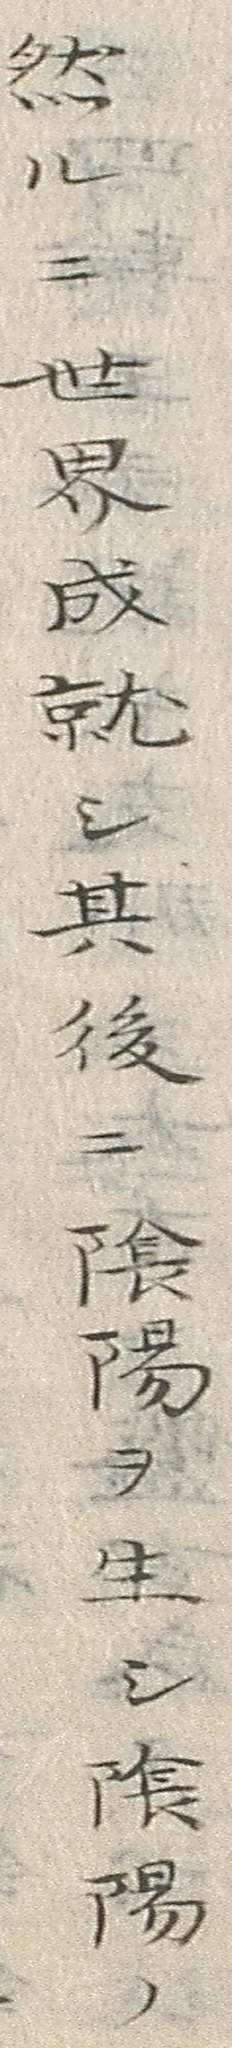然ルニ世界成就シ其後ニ陰陽ヲ生シ陰陽ノ
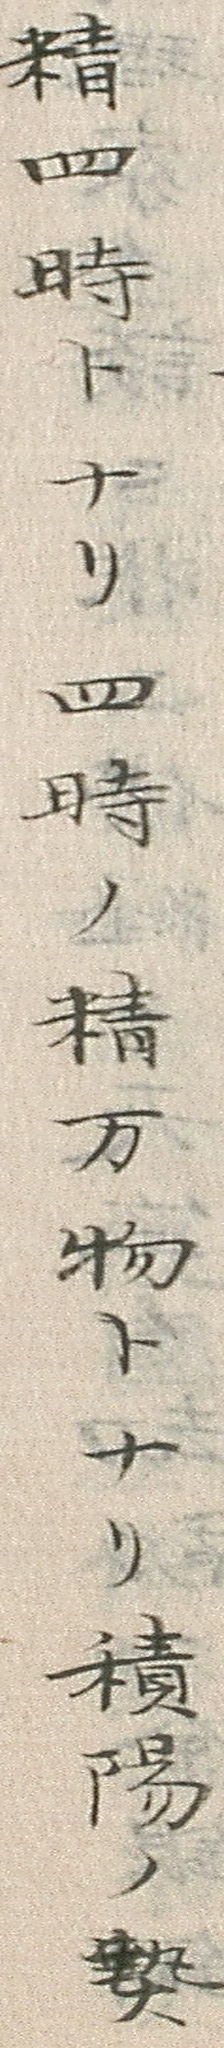精四時トナリ四時ノ精万物トナリ積陽之熱
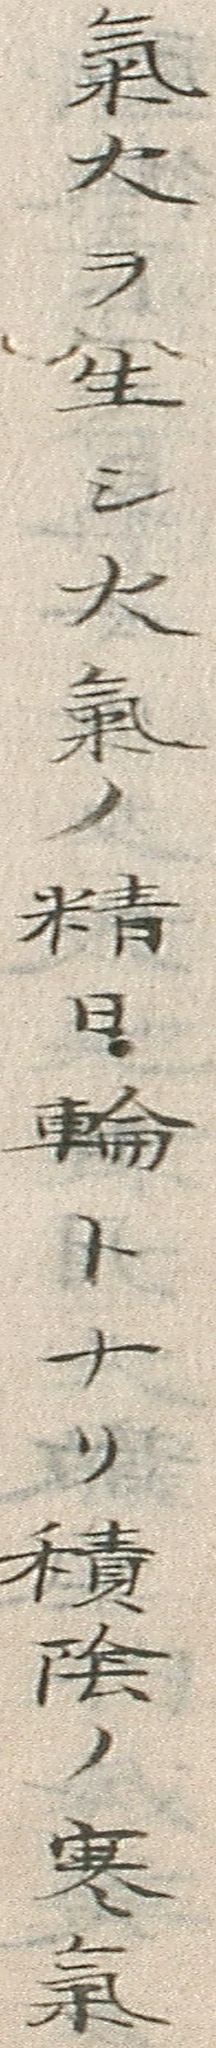気火ヲ生シ火気ノ精日輪トナリ積陰ノ寒気
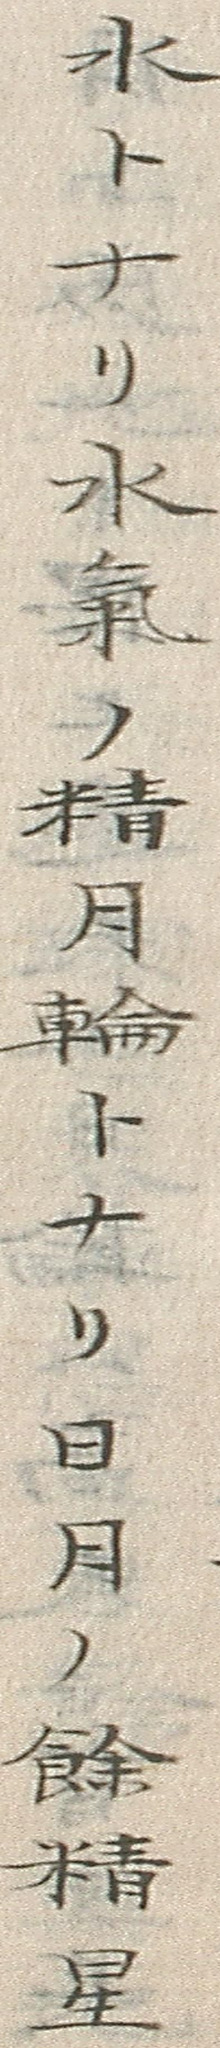水トナリ水気ノ精月輪トナリ日月ノ余精星
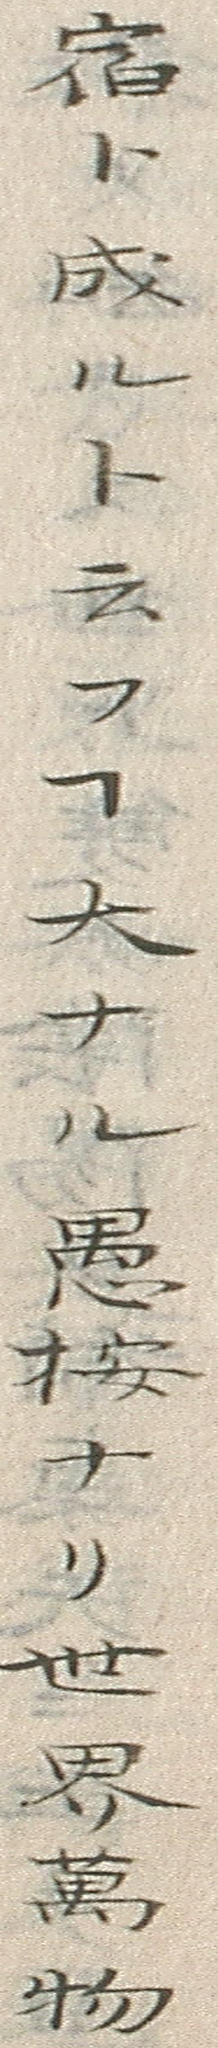宿ト成ルト云フコト大ナル愚按ナリ世界万物
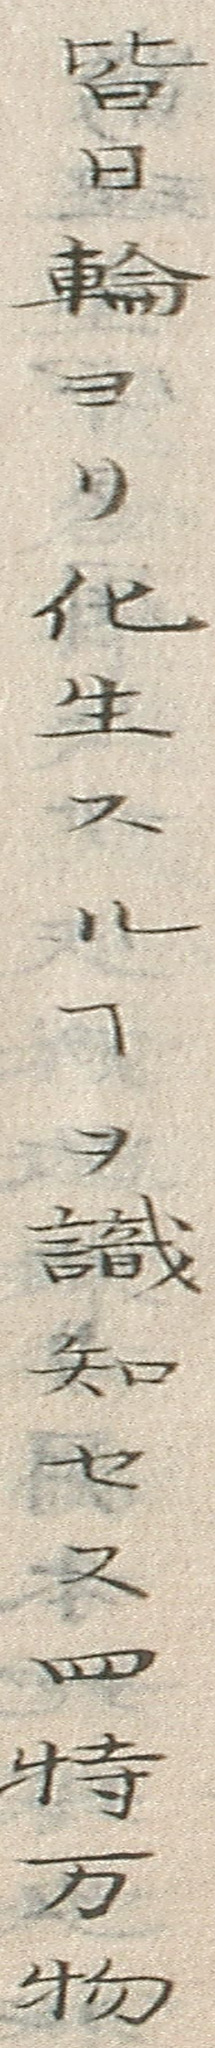皆日輪ヨリ化生スルコトヲ識知セス四時万物
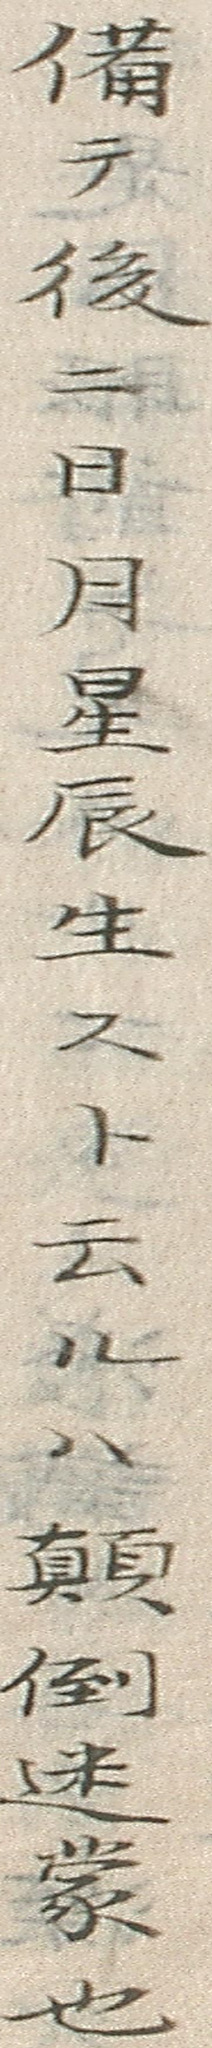備テ後ニ日月星辰生スト云ルハ顛倒迷蒙也
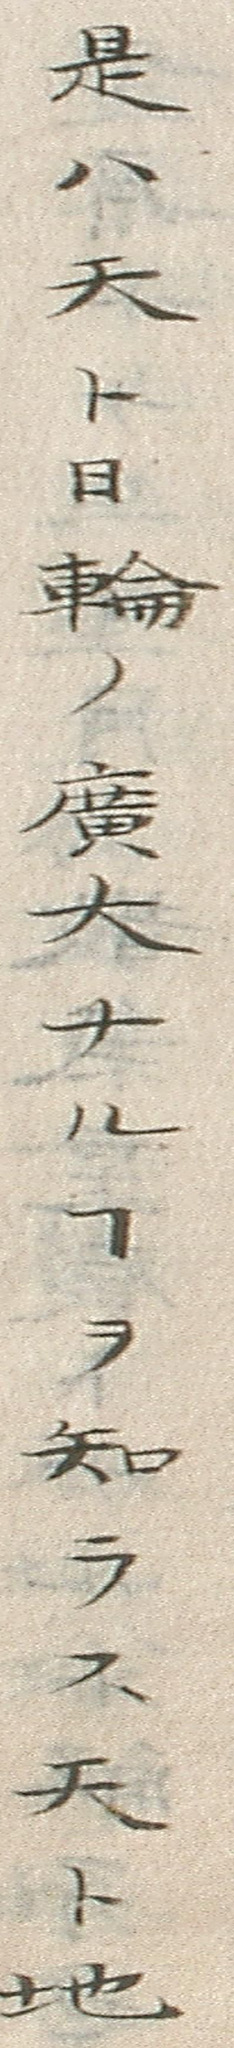是ハ天ト日輪ノ広大ナルコトヲ知ラス天ト地
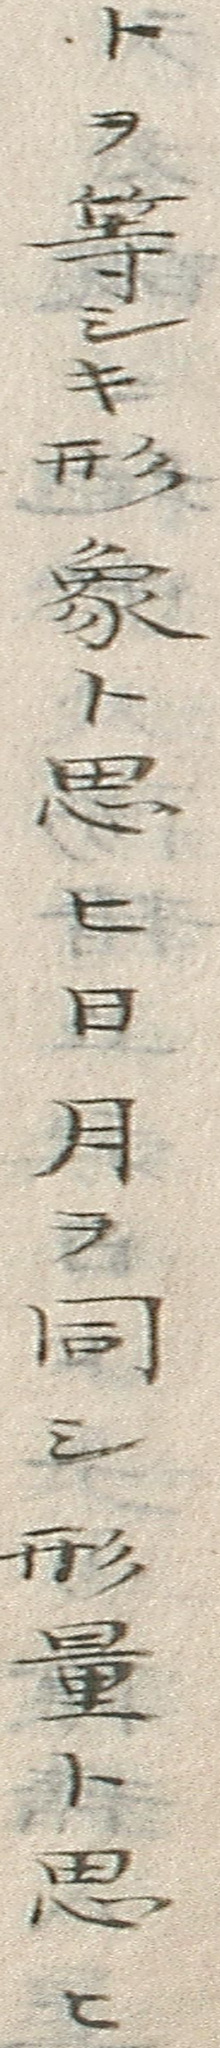トヲ等シキ形象ト思ヒ日月ヲ同シ形量ト思ヒ
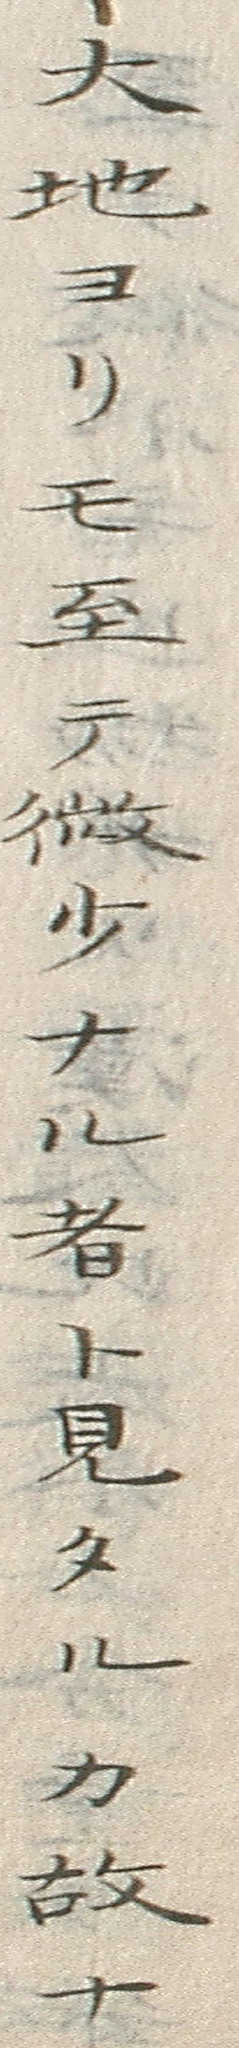大地ヨリモ至テ微少ナル者ト見タルカ故ナ
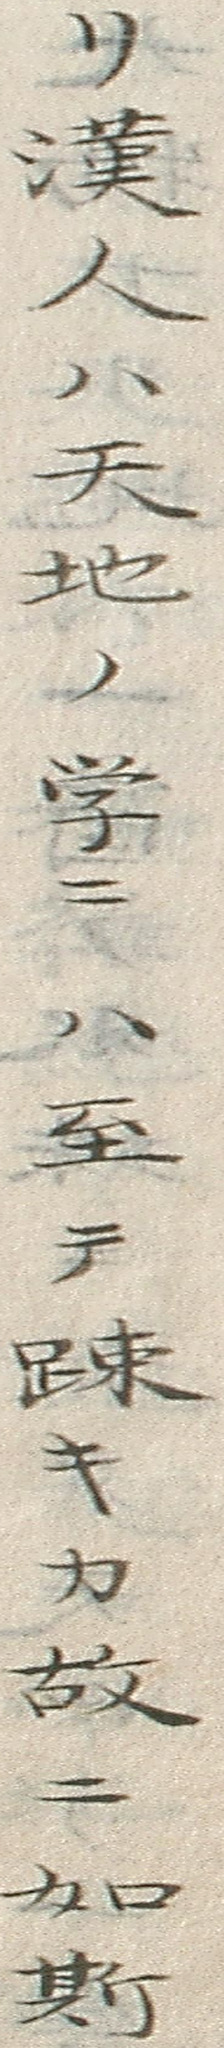リ漢人ハ天地ノ学ニハ至テ疎キカ故ニ如斯
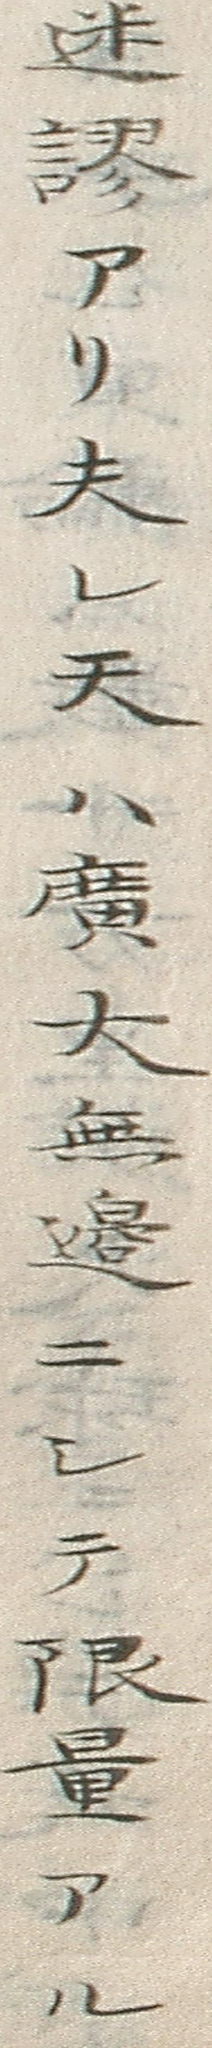迷謬アリ夫レ天ハ広大無辺ニシテ限量アル

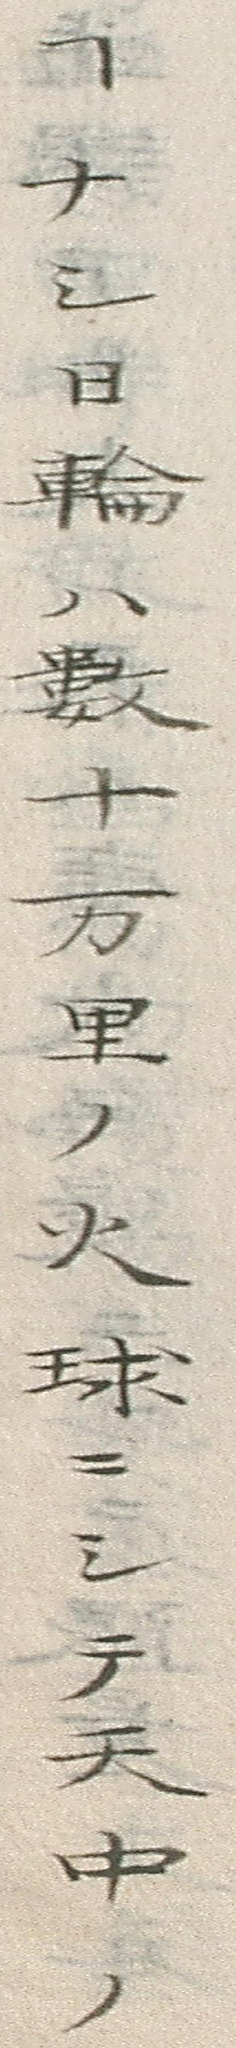コトナシ日輪ハ数十万里ノ火球ニシテ天中ノ
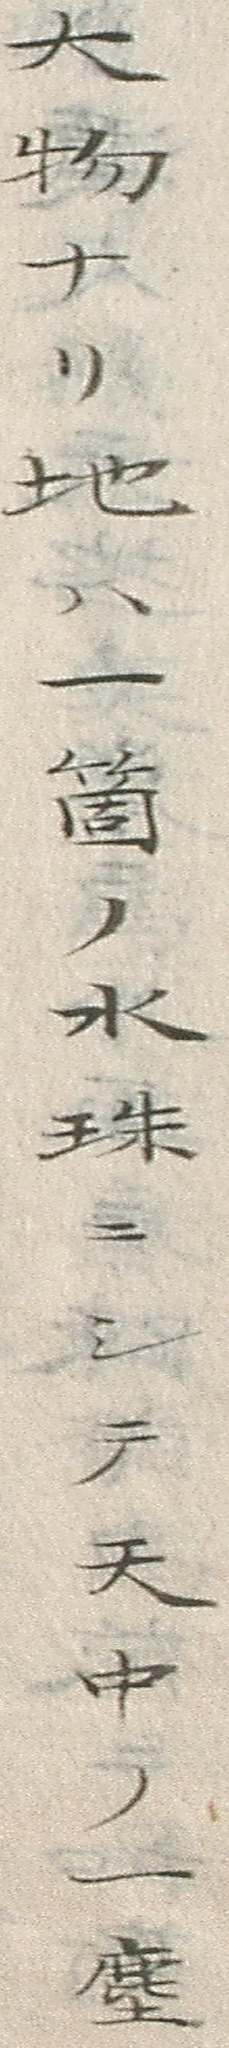大物ナリ地ハ一箇ノ水珠ニシテ天中ノ一塵
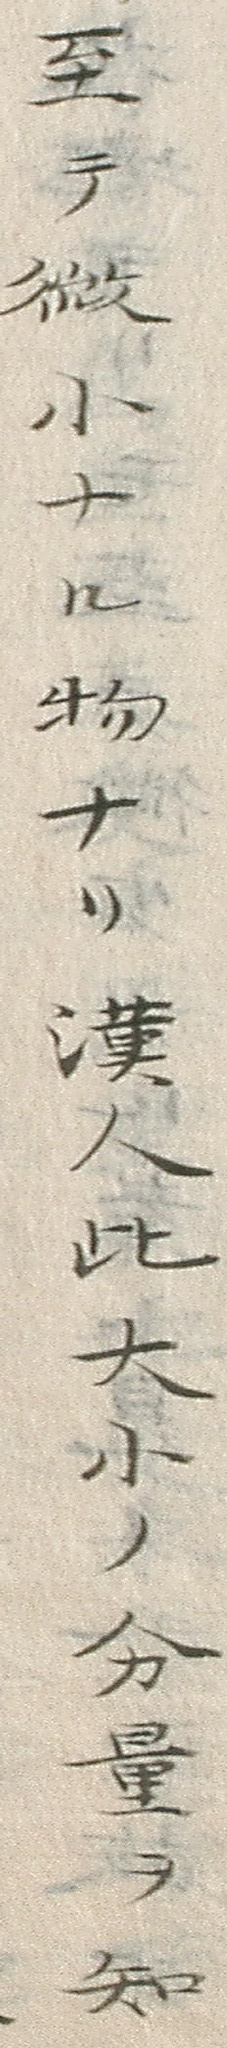至テ微小ナル物ナリ漢人此大小ノ分量ヲ知
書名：天學略名目羽翼　全
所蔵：東京大学地震研究所図書室 Earthquake Research Institute Library, The University of Tokyo, JAPAN
